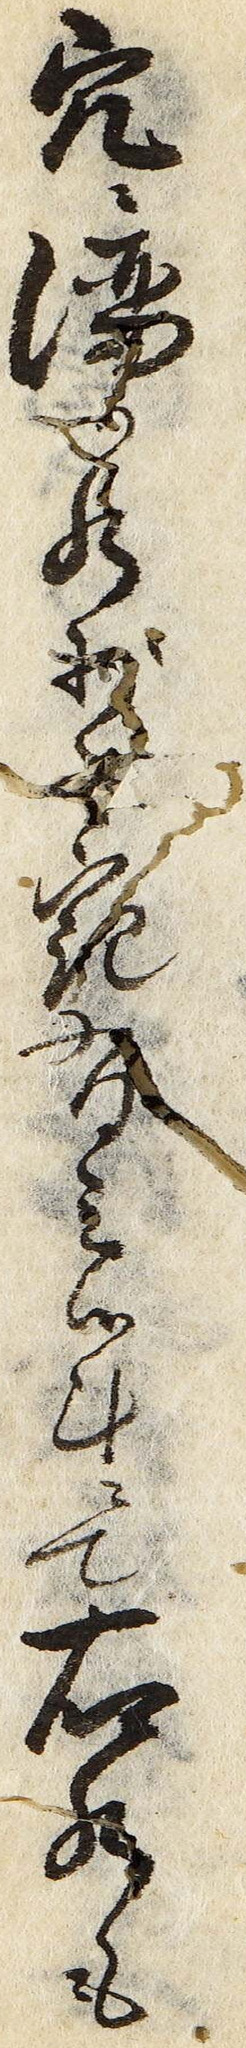穴ニ沸ク水少々宛有之候計ニて右水も
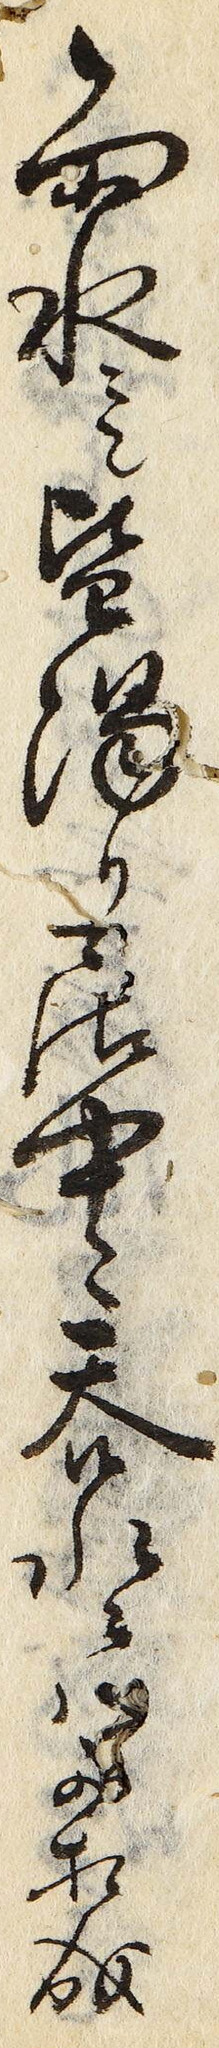雨水ニて皆濁り居中々呑水ニハ不相成
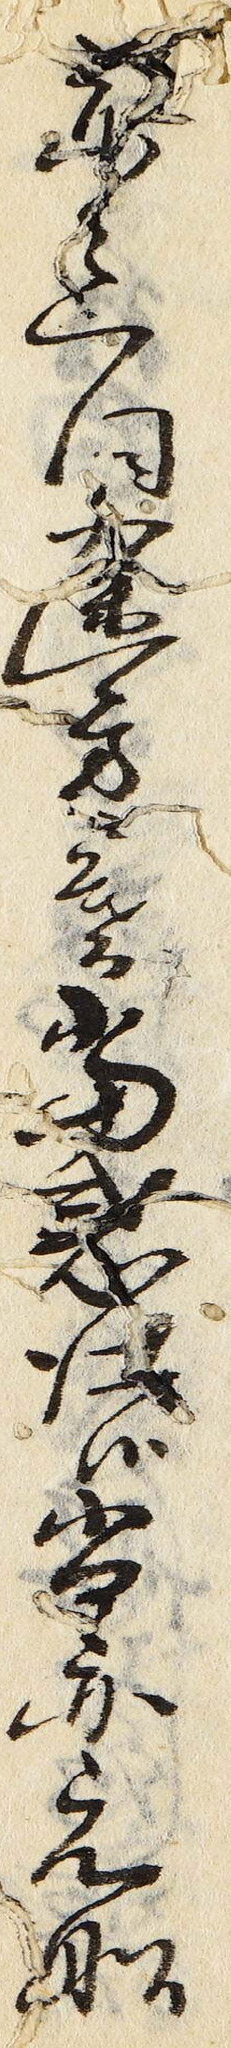亦々一同途方ニ暮当惑仕候尚亦元船
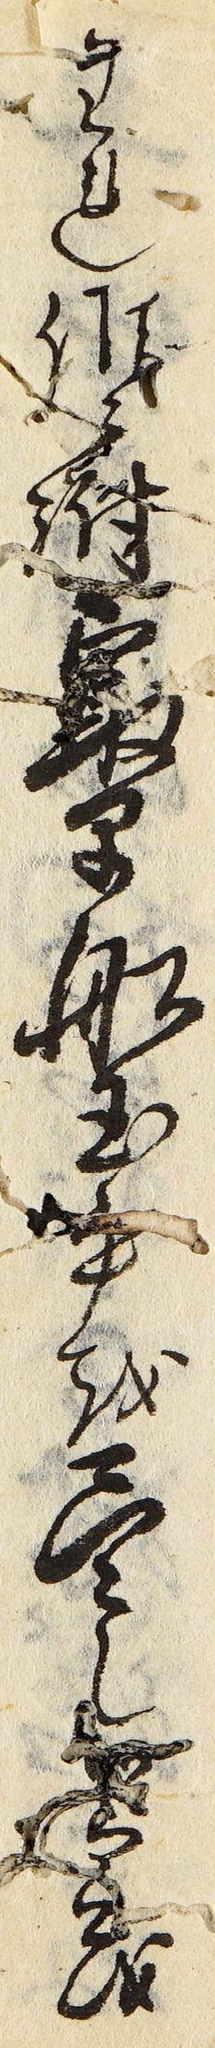とれ候ニ付最早船玉手を尽し候而も
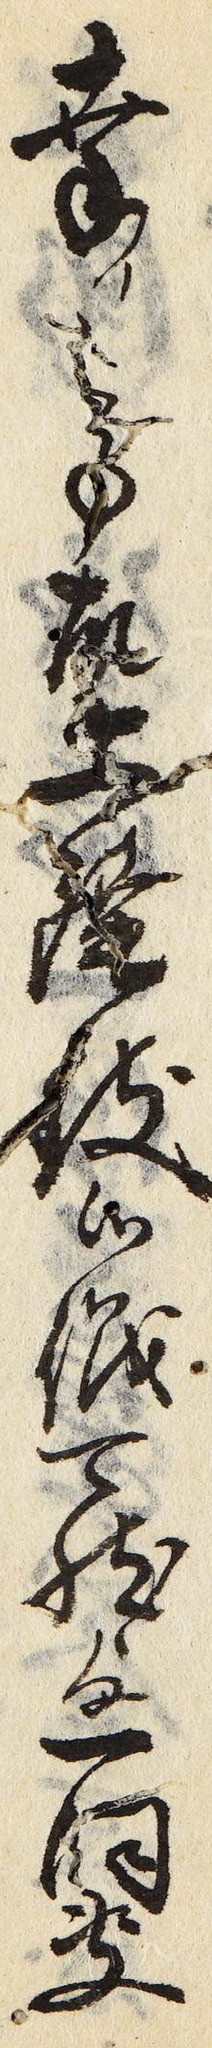幸イ之事故上陸致候儀可然与一同決
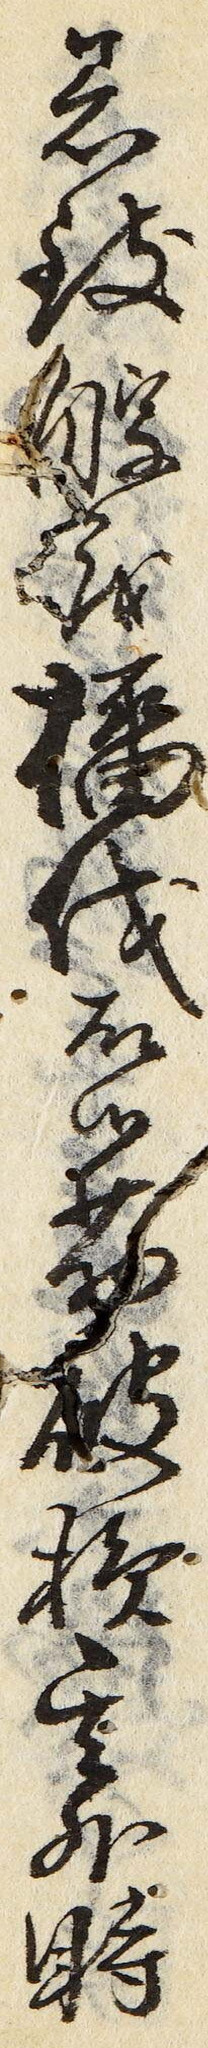着致艀も檣伐取候破損其外時
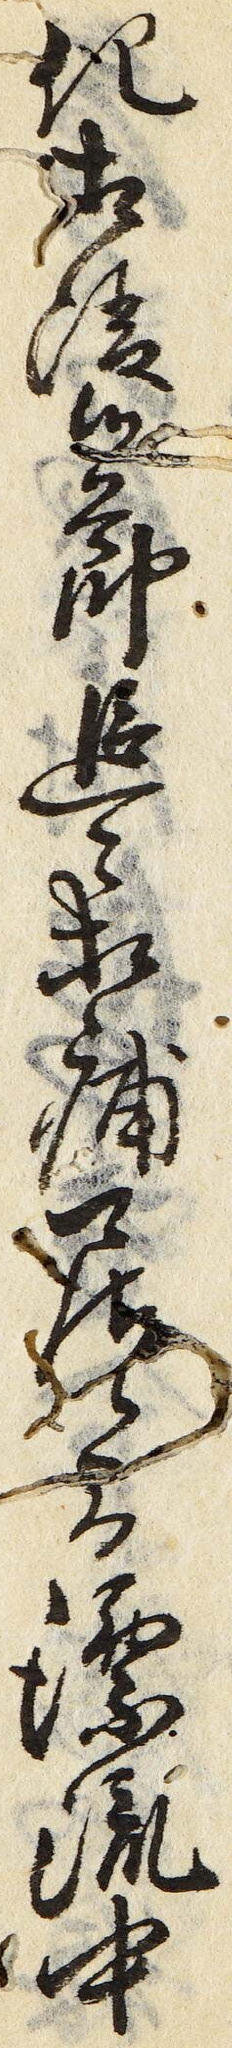化相凌候節追々相痛居候間漂流中
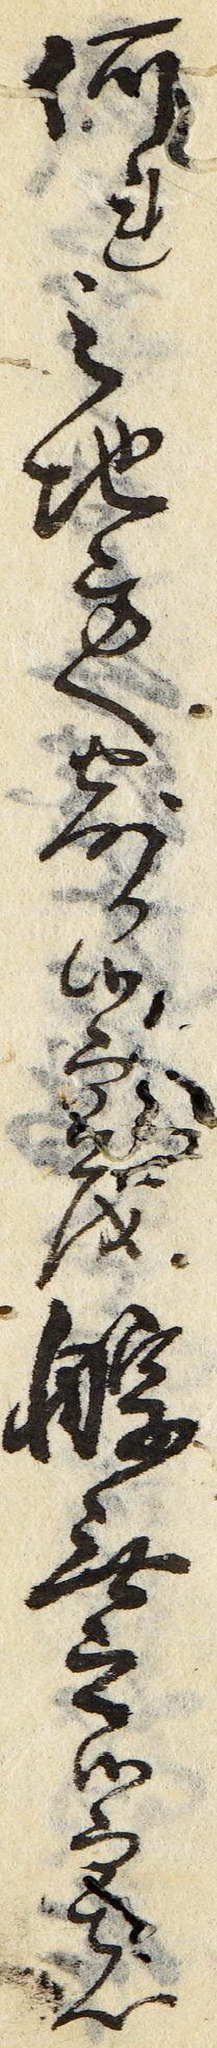何れ之地方へ寄り候而も艀無之候而は
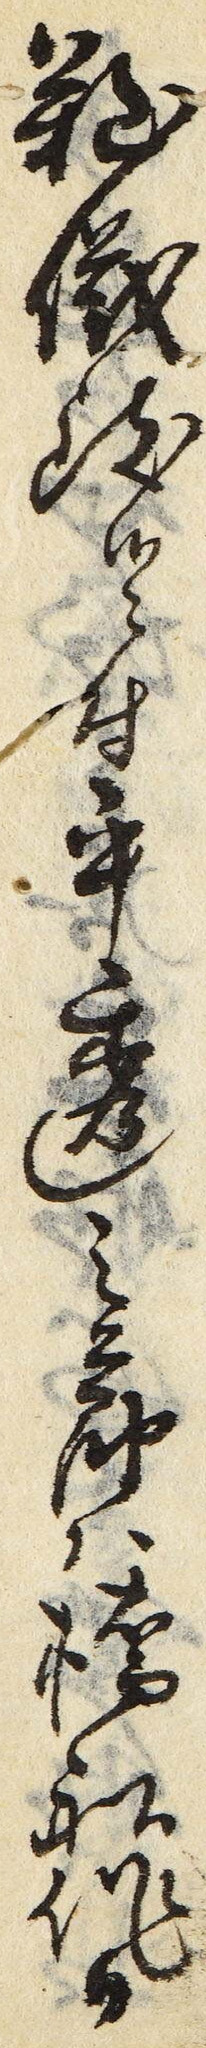難儀致候ニ付手透之節ハ橋船作り

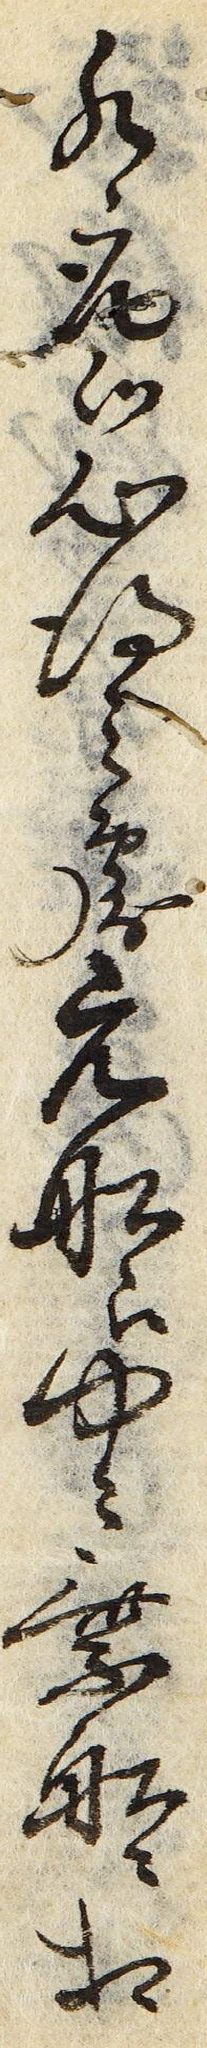水取候心得之処元船え中々乗船ニ相
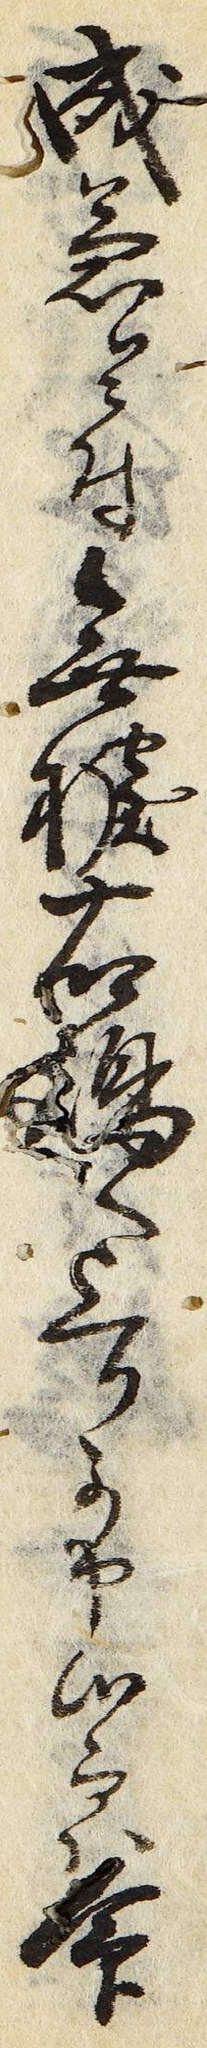成兼候ニ付無拠右嶋へ上り不申候而ハ命
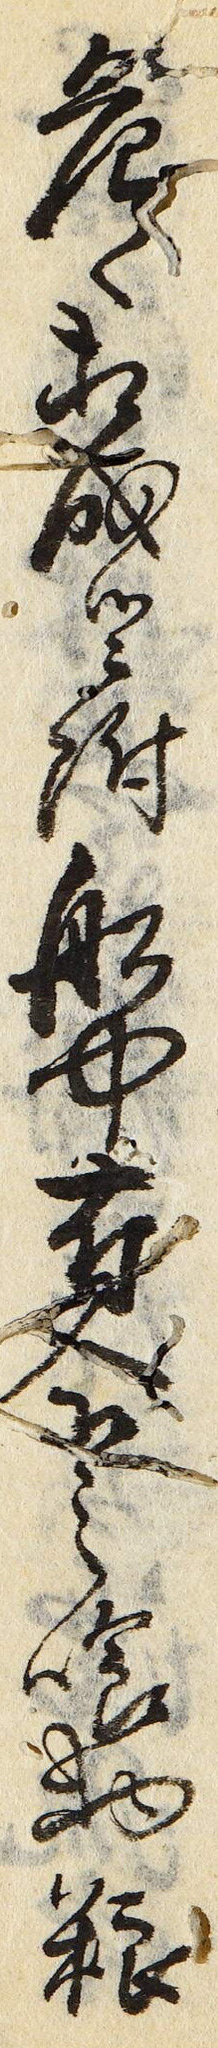危く相成候ニ付船中有合之喰物粮
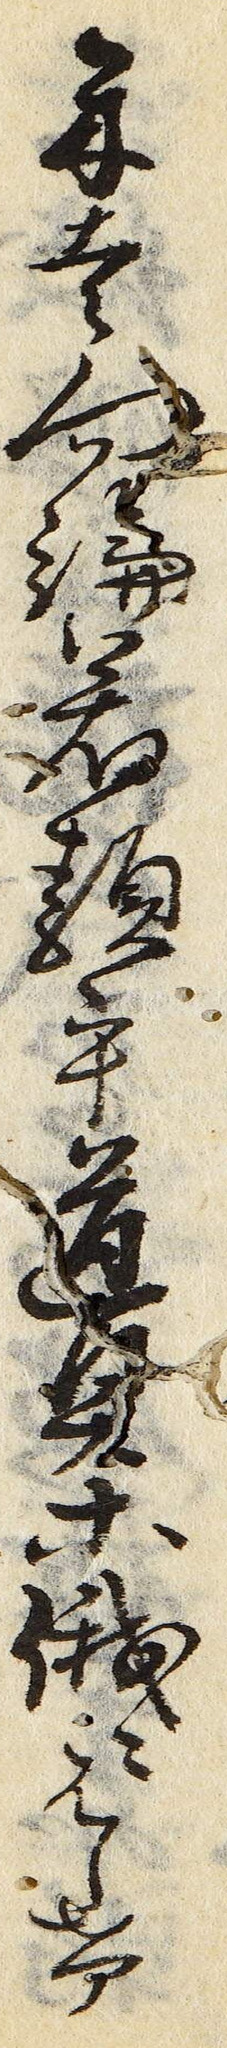米者勿論着類手道具等俄ニはしけ
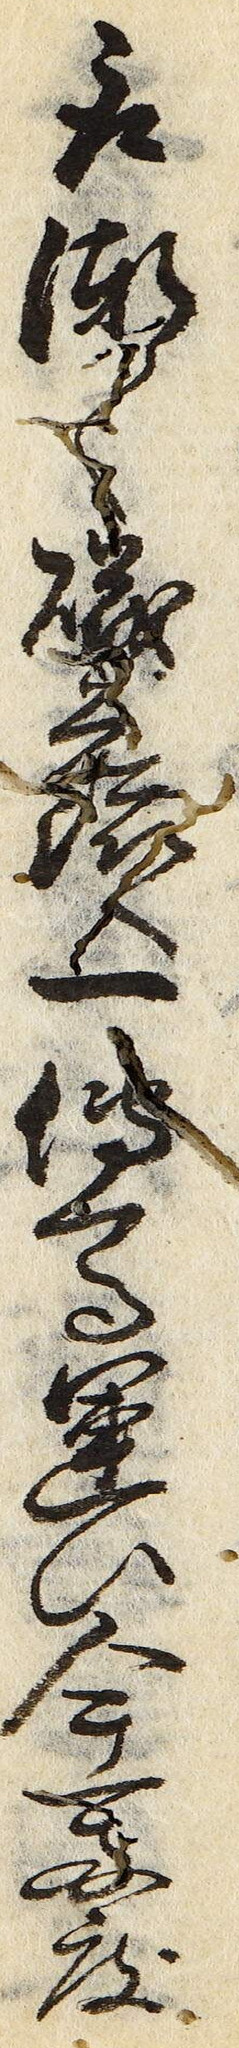取漸く磯蔭へ一伝馬運ひ今一度度
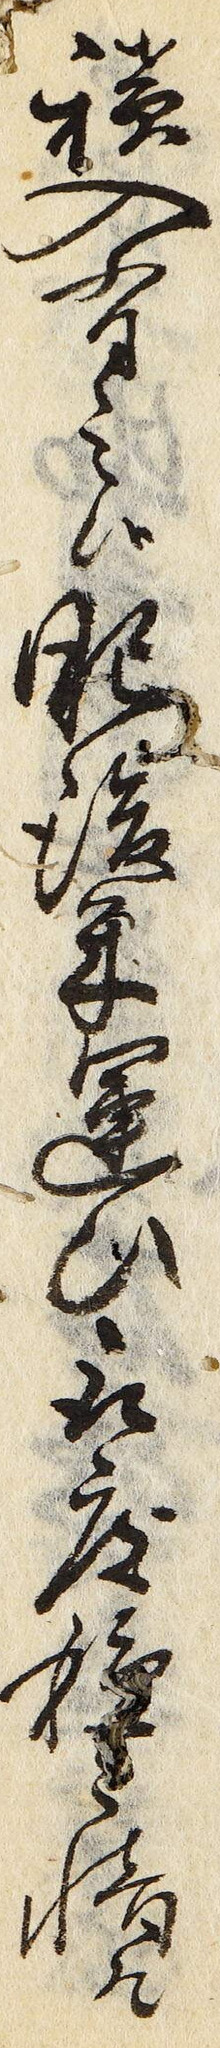積入有之候肥後米運ひ取度種々
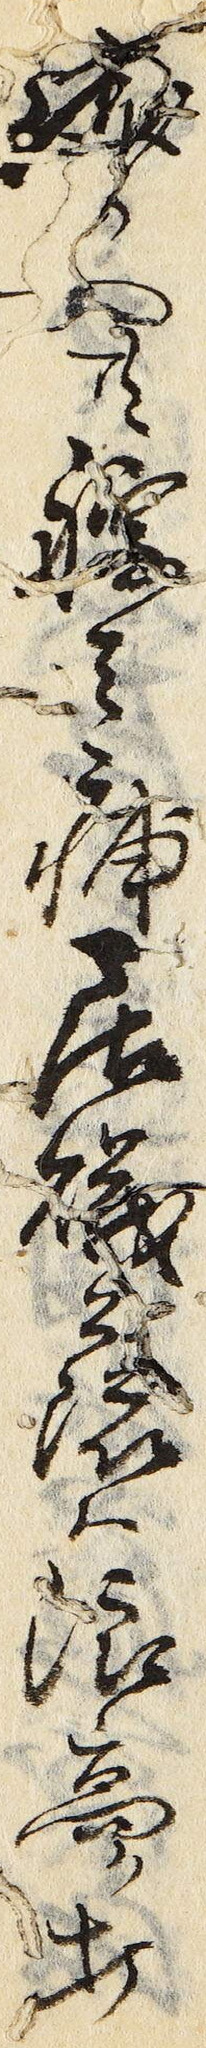候得共艀之痛居磯蔭ハ浪高ク打
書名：阿波幸宝丸漂流記
